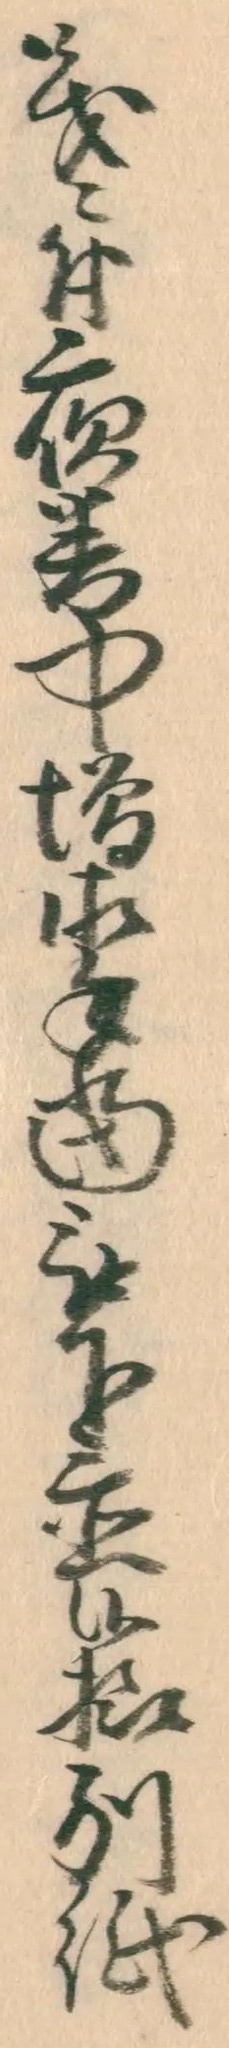義ニ付夜番中増御手当被下置候様別紙
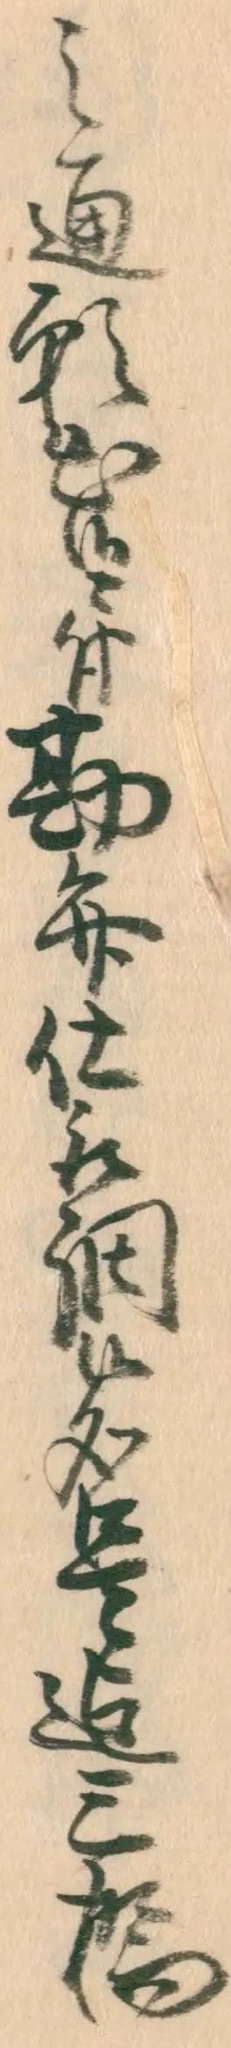之通願出候ニ付勘弁仕取調候処是迄三橋
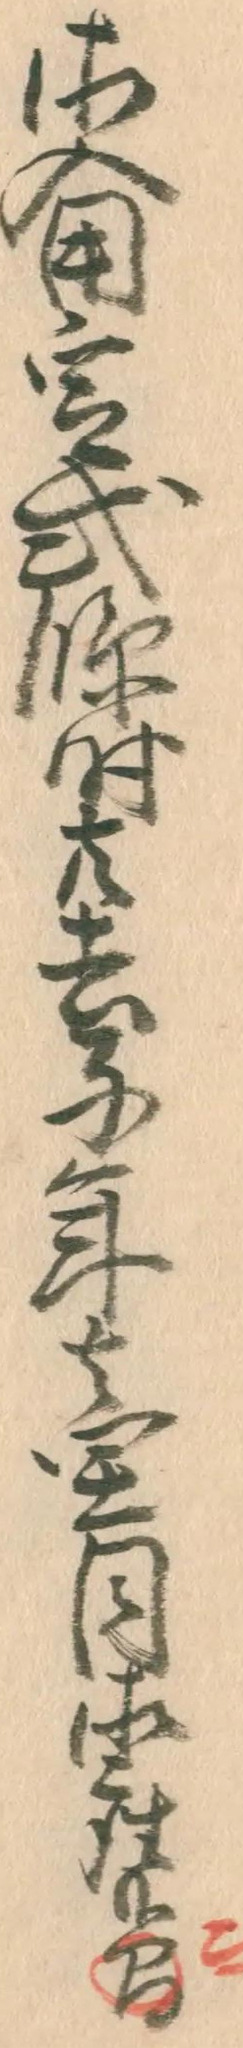御入用定式臨時共去子年は閏月御座候「間」而
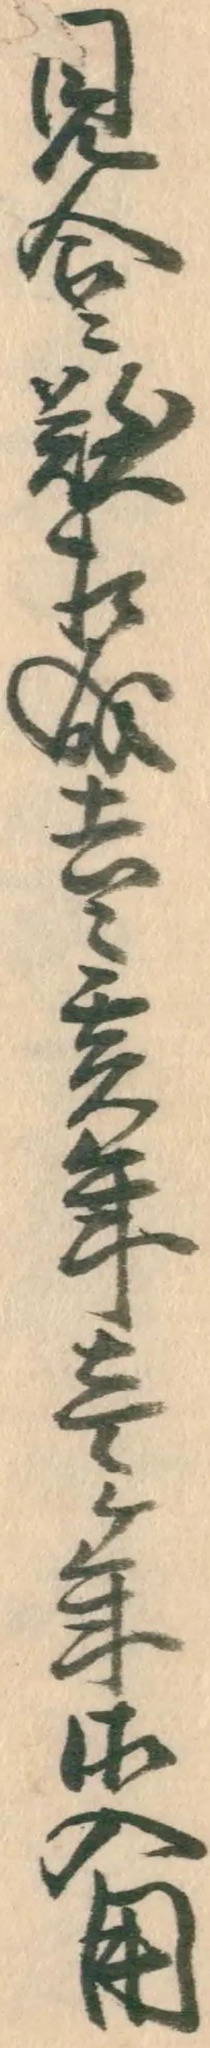見合ニ難相成去々亥年壱ケ年御入用

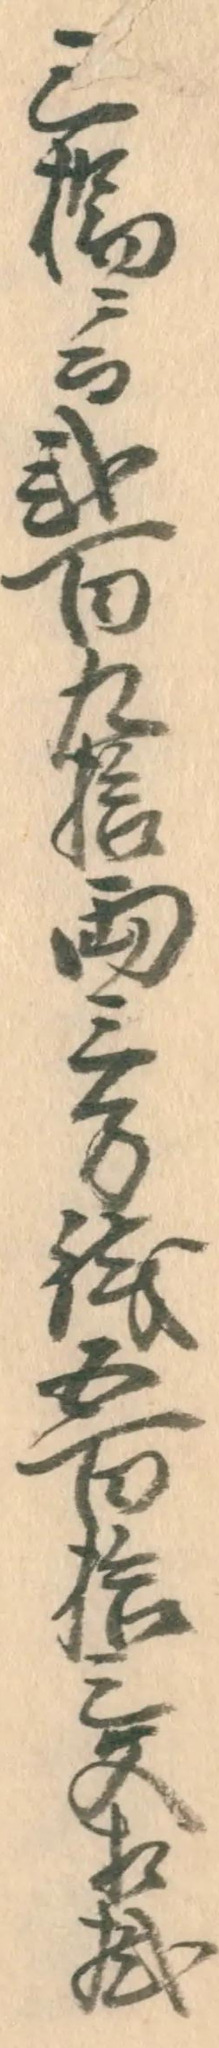三橋ニ而弐百九拾両三分銭五百拾三文相掛
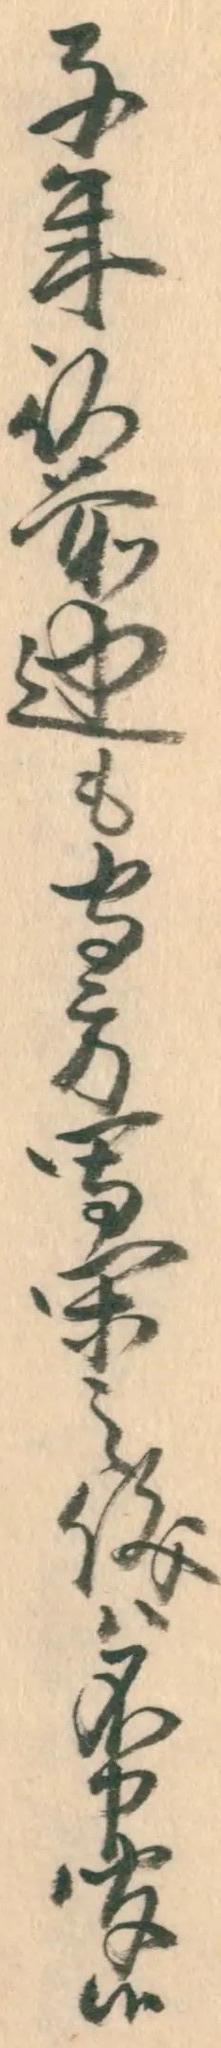子年以前迚も守方等閑之儀は不申聞候
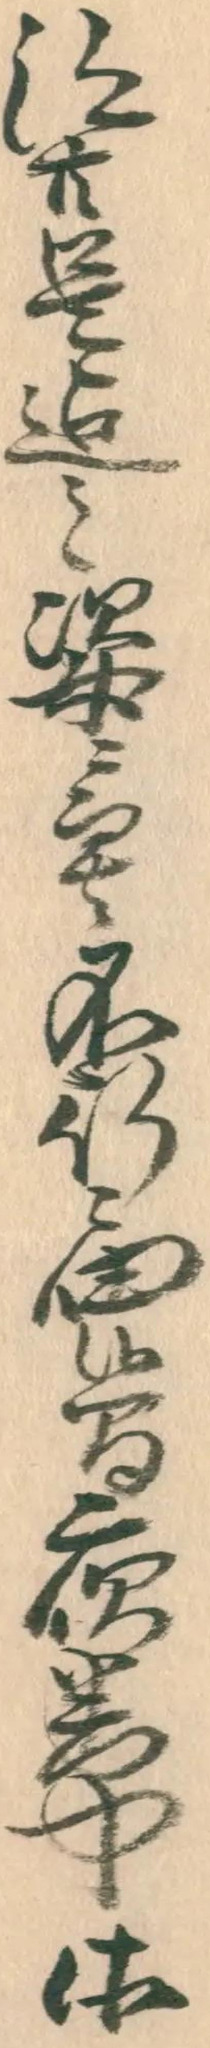得共是迄之姿ニ而は不行届候間夜番中御
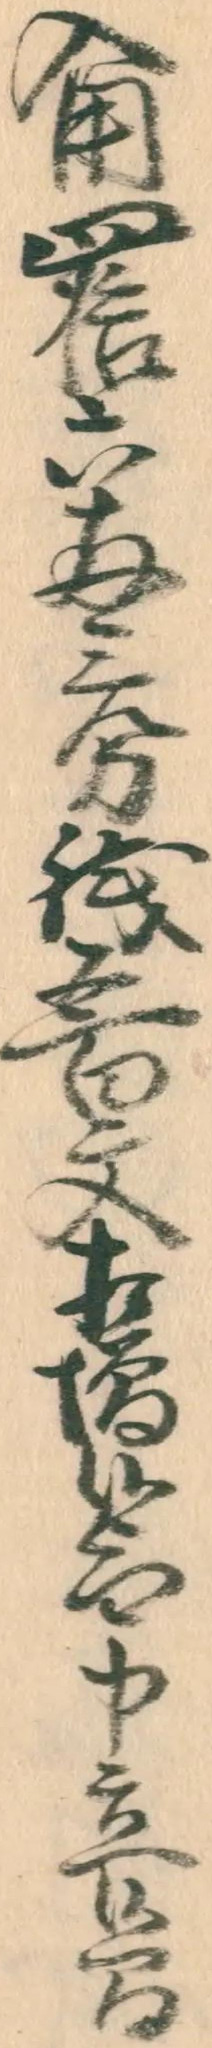入用四拾六両三分銭五百文相増候旨申立候間
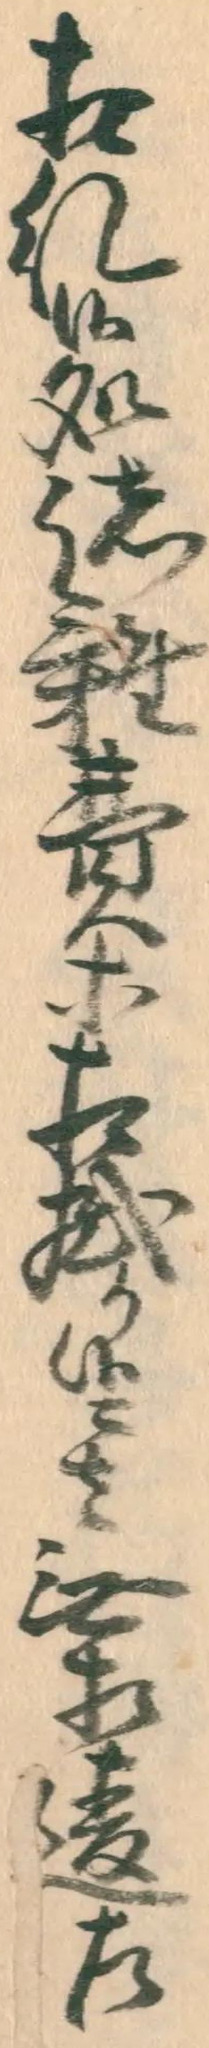相糺候処諸雑費等相掛り候ニは無相違左
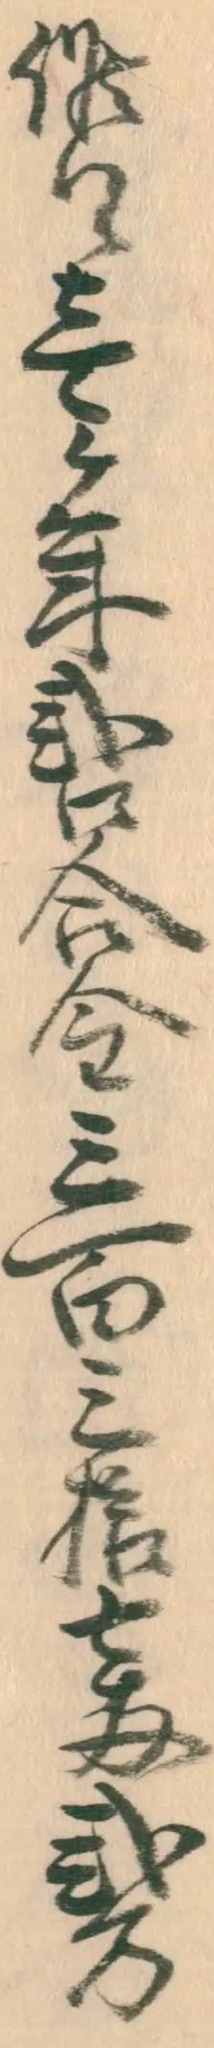候ハヽ壱ケ年弐口合金三百三拾七両弐分
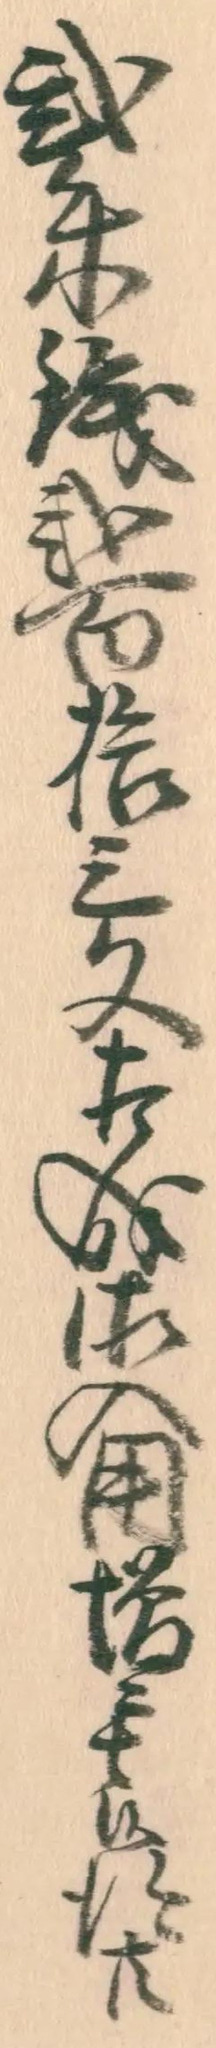弐朱銭弐百拾三文相成御入用増ニは候得共
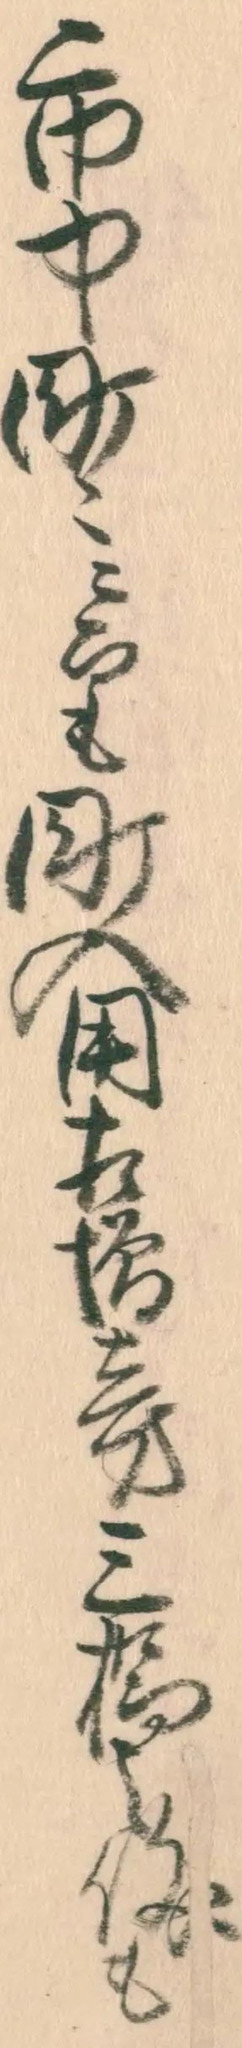市中町々ニ而も町入用相増旁三橋之儀も
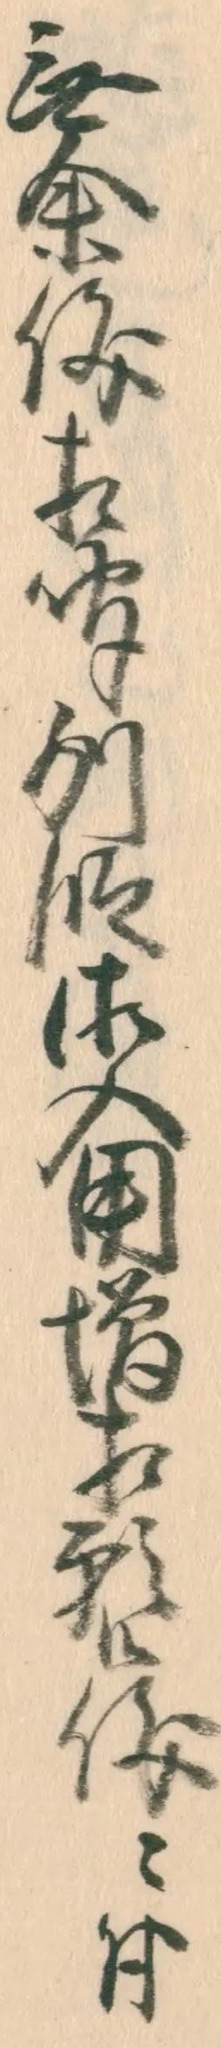無余儀相聞別段御入用増相願候儀ニ付
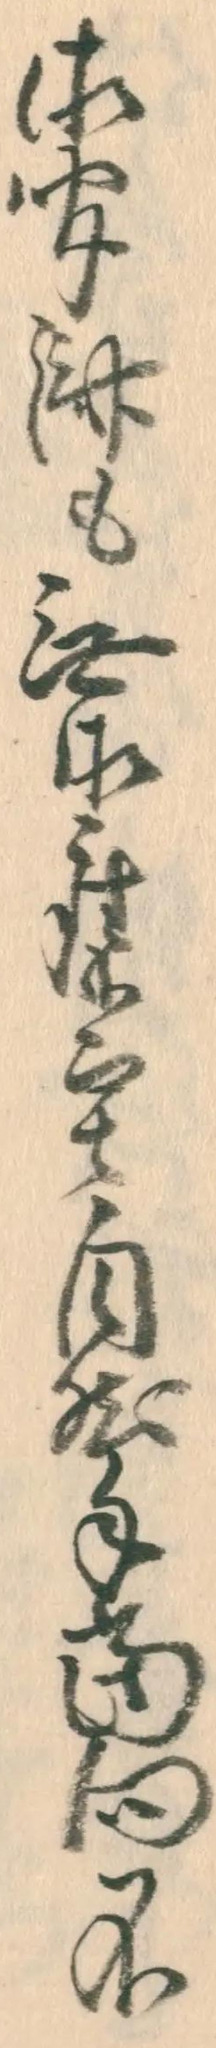御聞済も無御座候而は自然手当向不
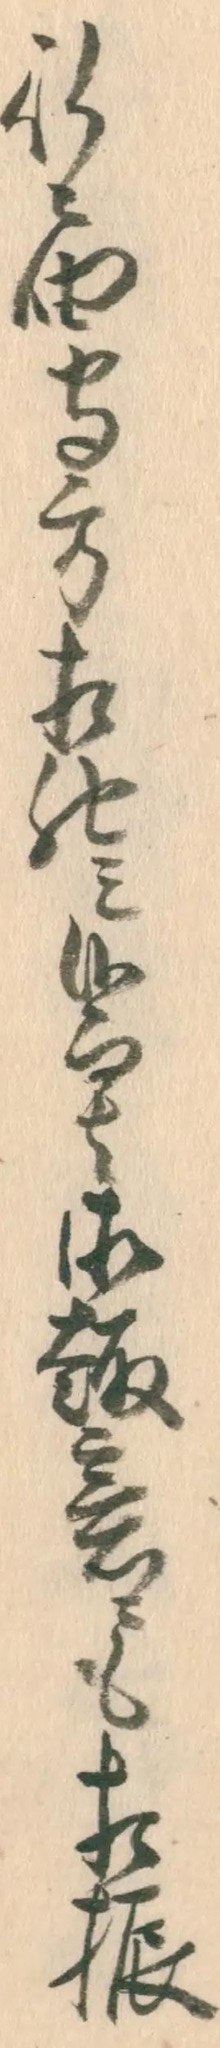行届守方相弛ミ候而は御趣意ニも相振
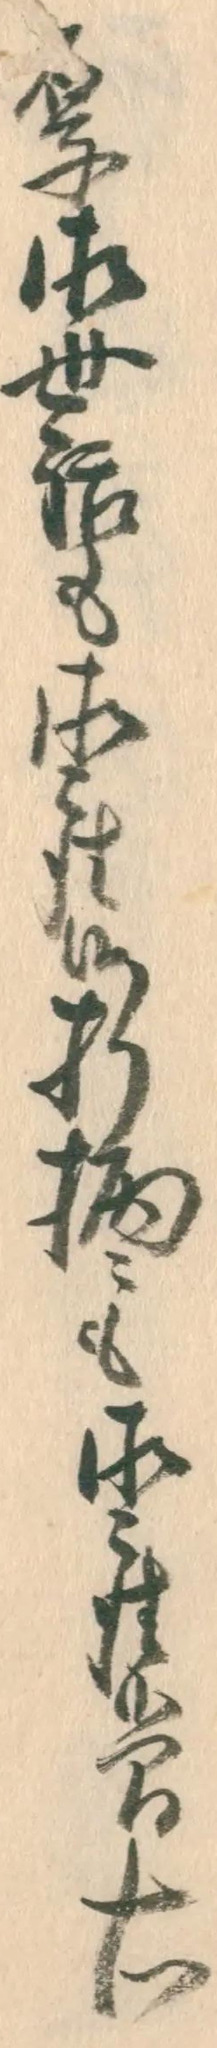厚御世話も御座候折柄ニも御座候間右
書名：三橋 17巻. [7] 三橋小破御修復書留　但御奉行御掛リ替地震潰橋番屋　嘉永四亥年より安政二卯年迄　上
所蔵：国立国会図書館 National Diet Library, JAPAN
